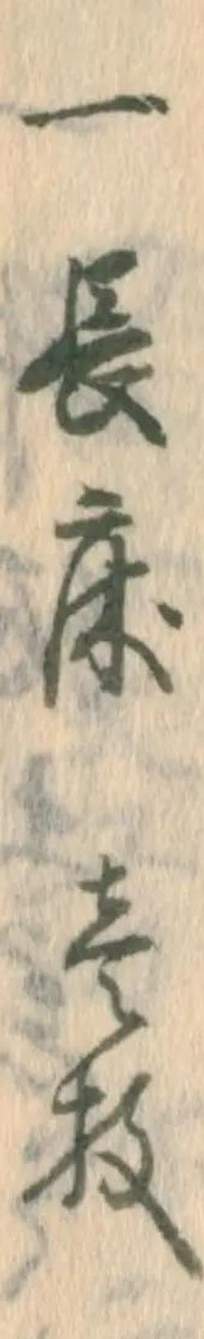一長床壱枚
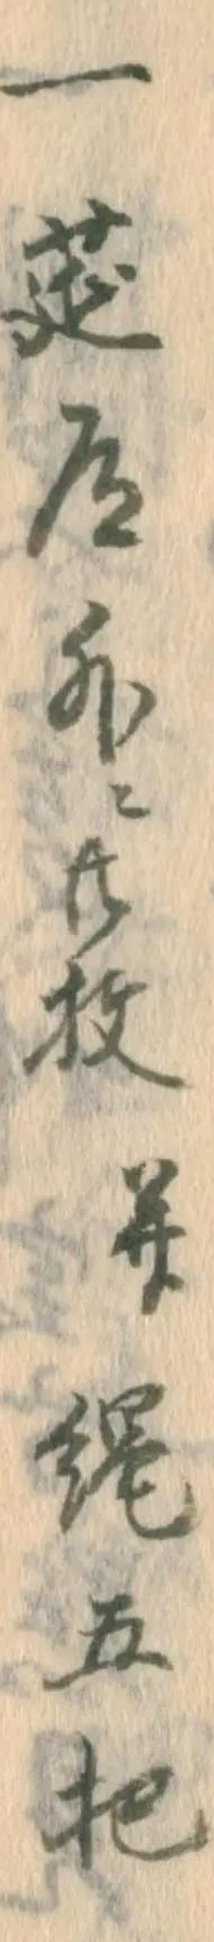一筵道外ニ廿枚并縄五把
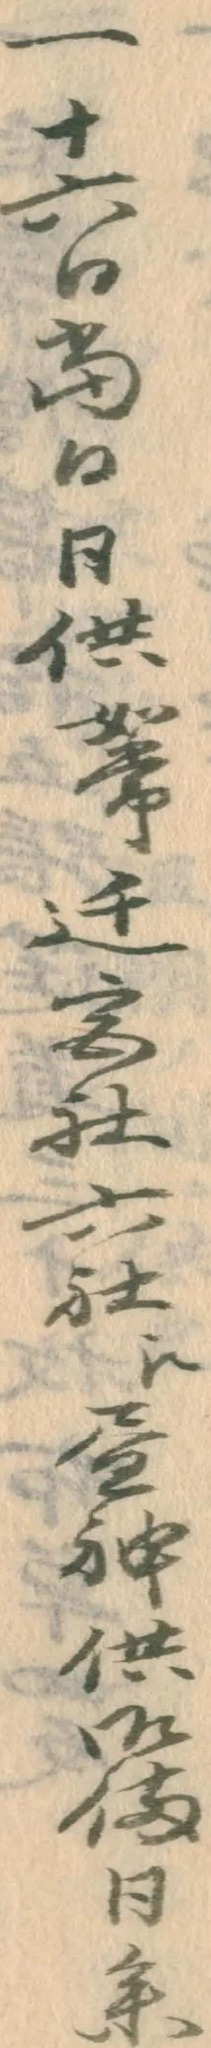一十六日当日日供如常迁宮社六社江昼神供御備日参
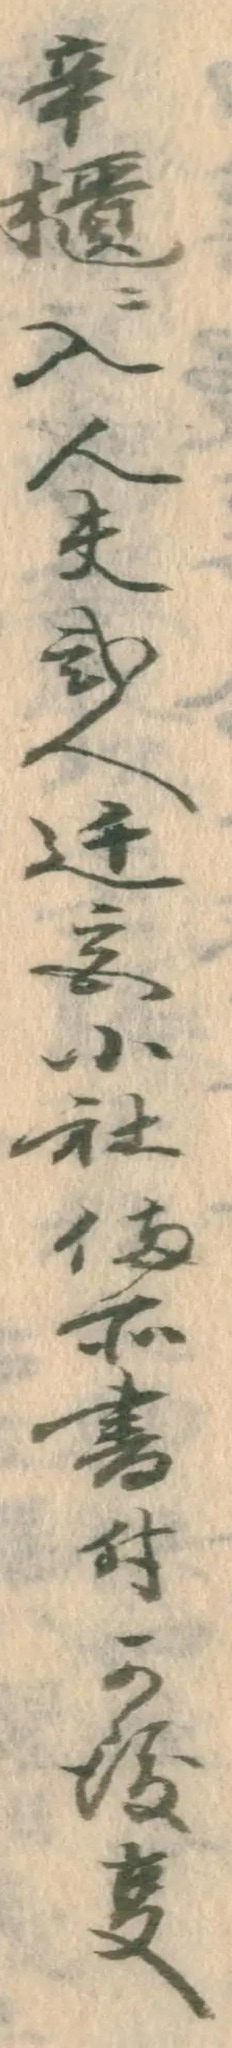辛櫃ニ入人夫弐人迁宮小社備所書付可渡事
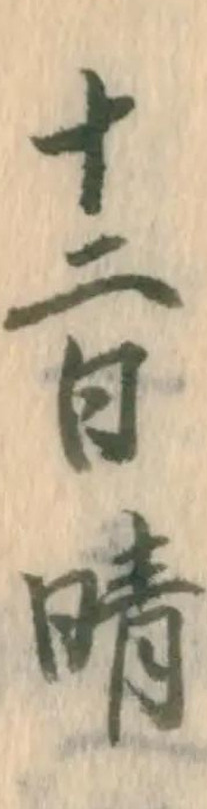十二日晴
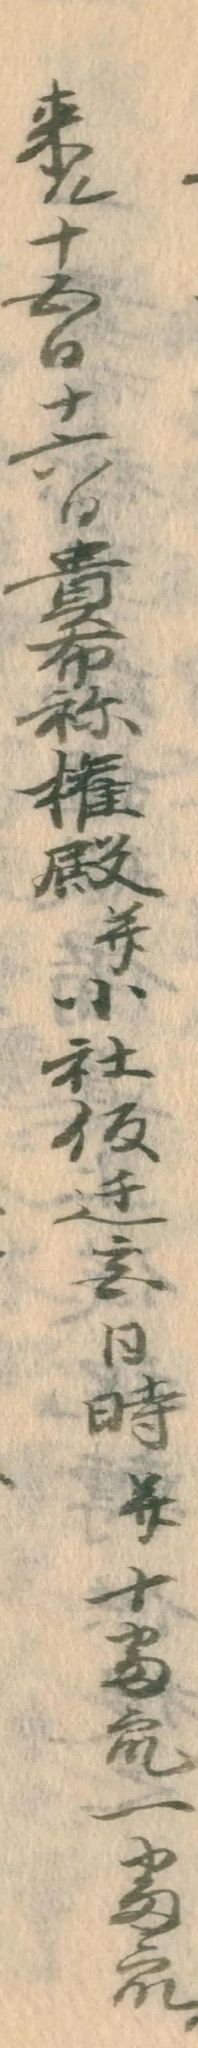一来ル十五日十六日貴布祢権殿并小社仮迁宮日時并十番衆一番衆ゟ
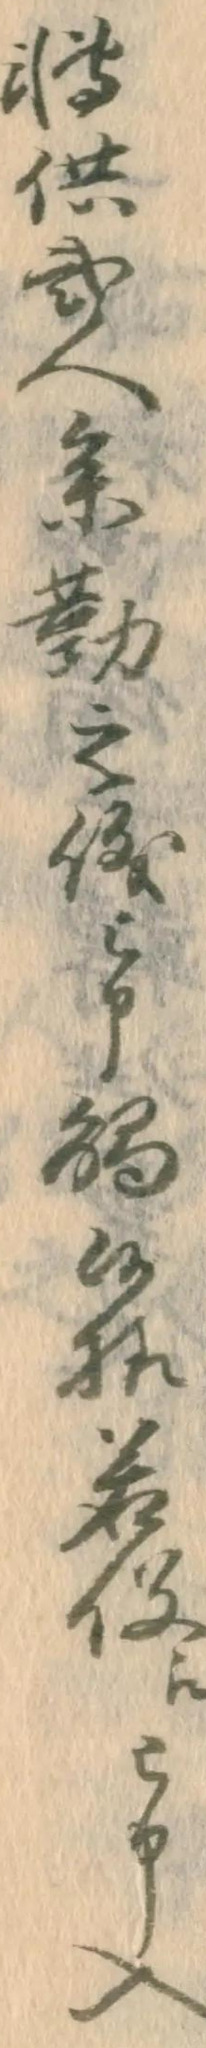転供弐人参勤之儀被申触候様若役江被申入
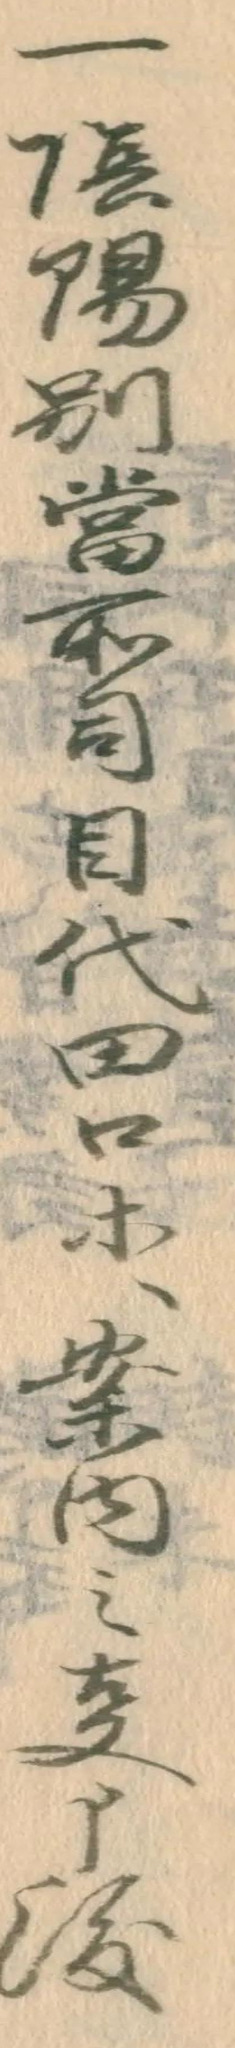一陰陽別当所司目代田口等へ案内之事申渡
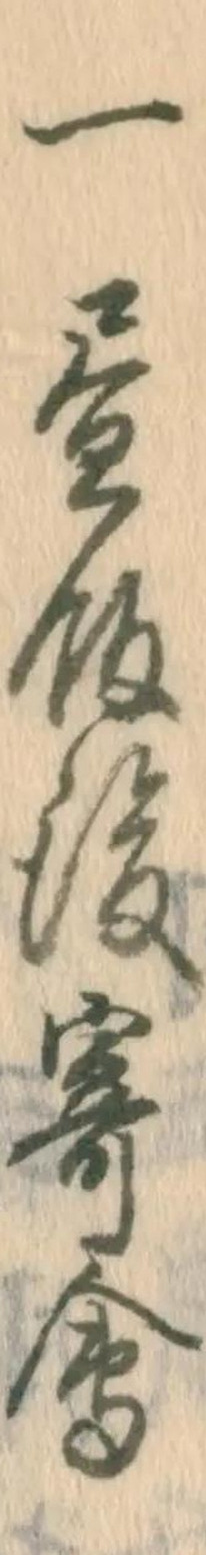一昼飯後寄会
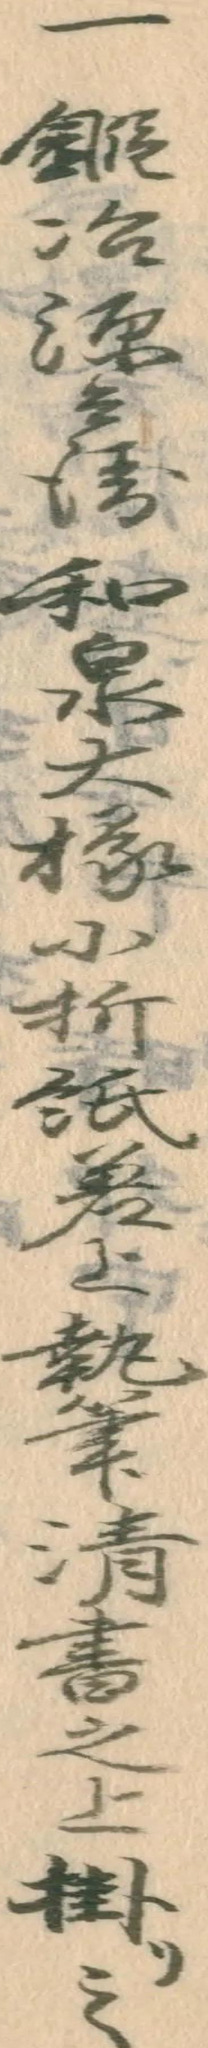一鍛冶源兵衛和泉大椽小折紙差上執筆清書之上掛リ之
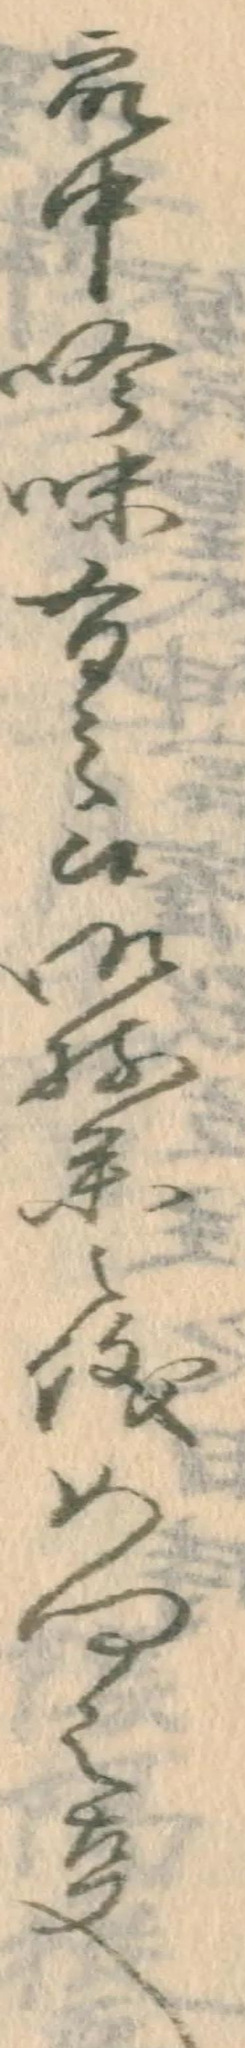衆中吟味有之候御持参之儀如何之事
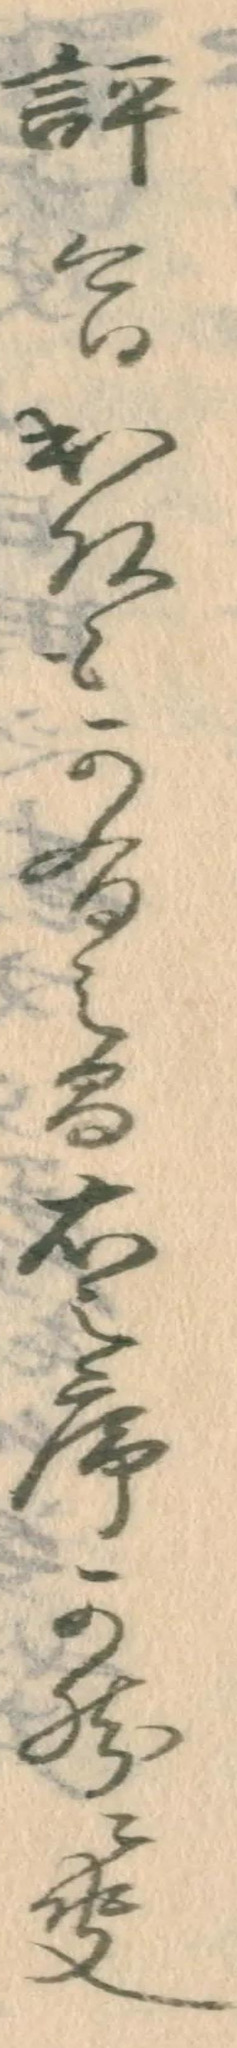評今日出頭も可有之間右之席可然ニ決
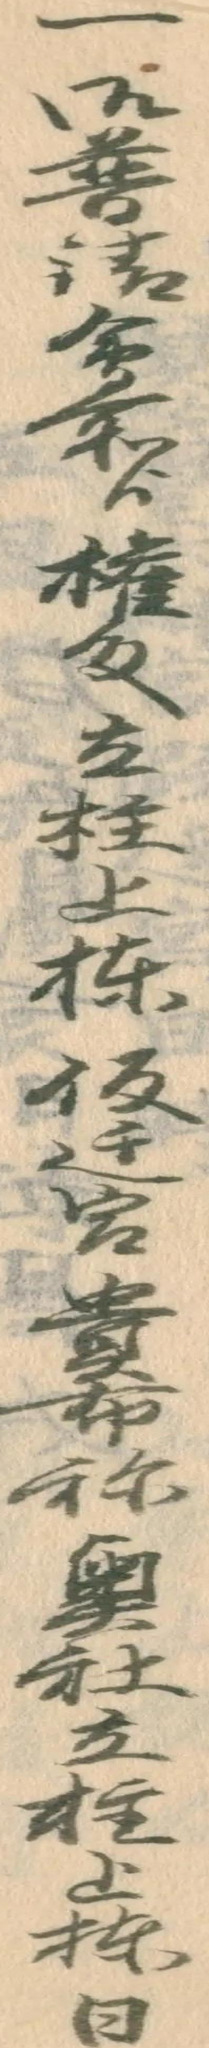一御普請会所ゟ権殿立柱上棟仮迁宮貴布祢奥社立柱上棟日
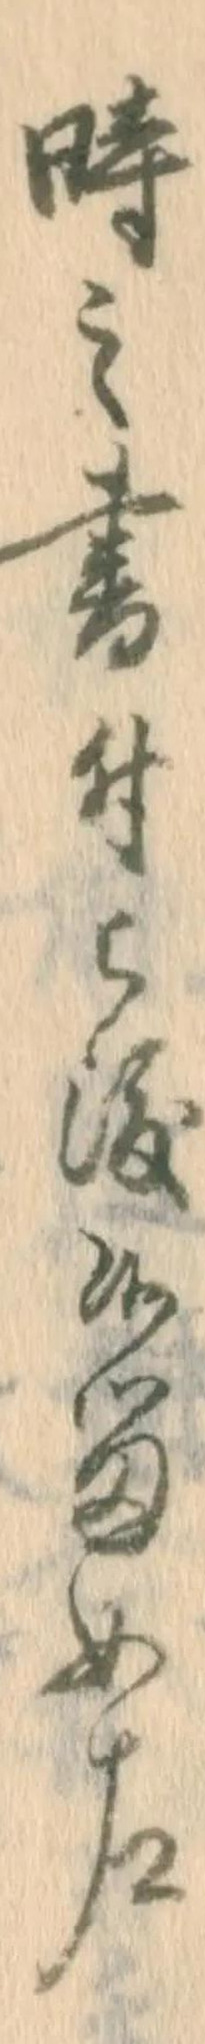時之書付被渡候留如左
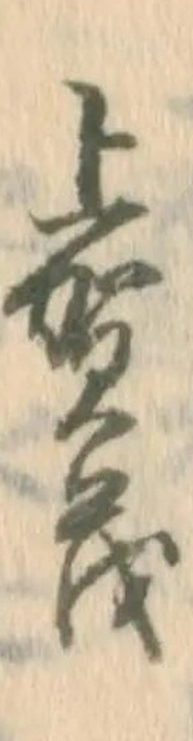上賀茂
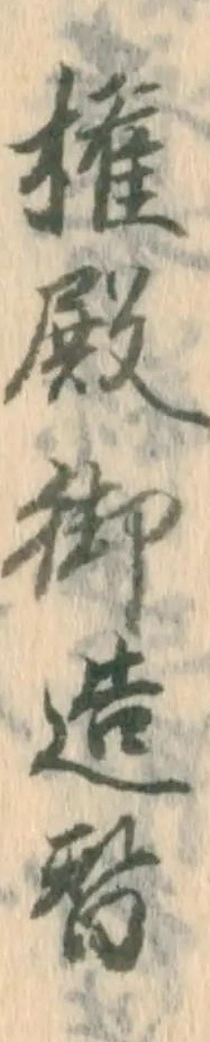權殿御造替
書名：賀茂社記録. 第17冊
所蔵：国立国会図書館 National Diet Library, JAPAN
